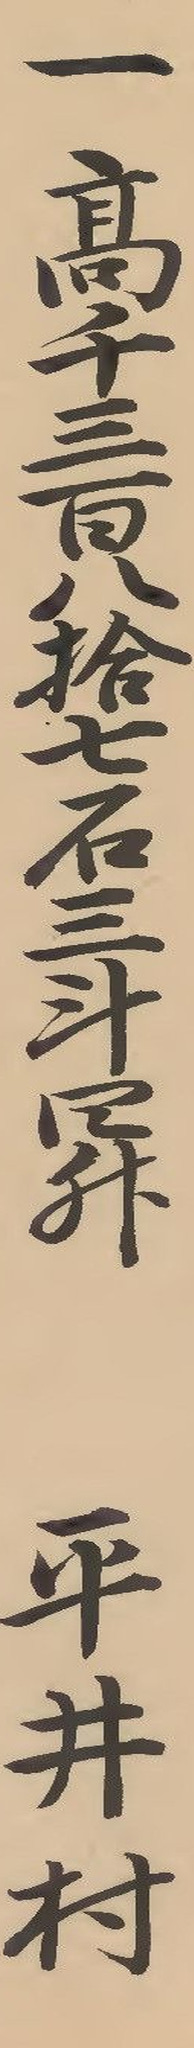一高千三百八拾七石三斗四升平井村
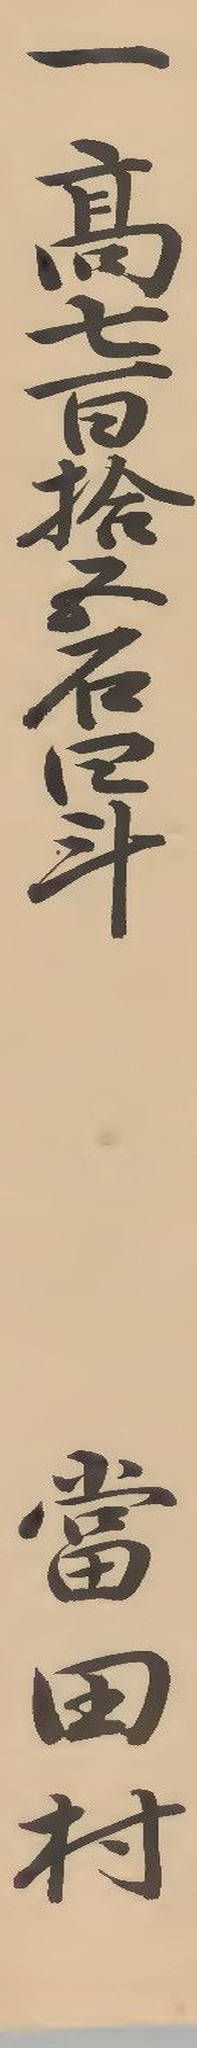一高七百拾五石四斗当田村
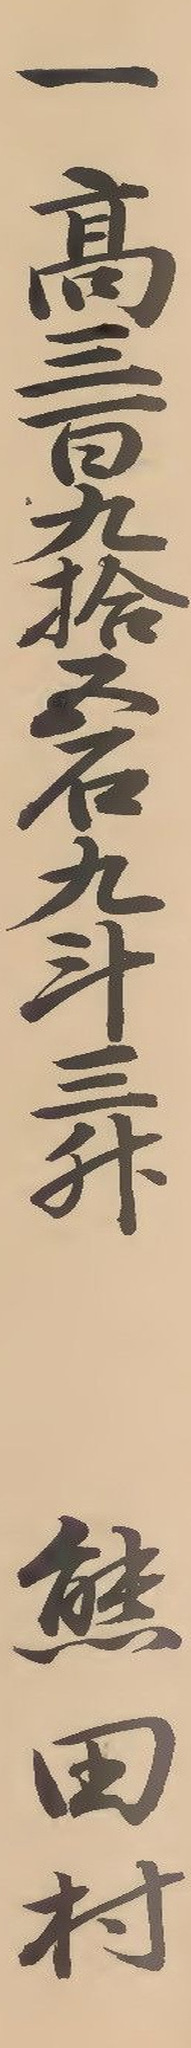一高三百九拾五石九斗三升熊田村
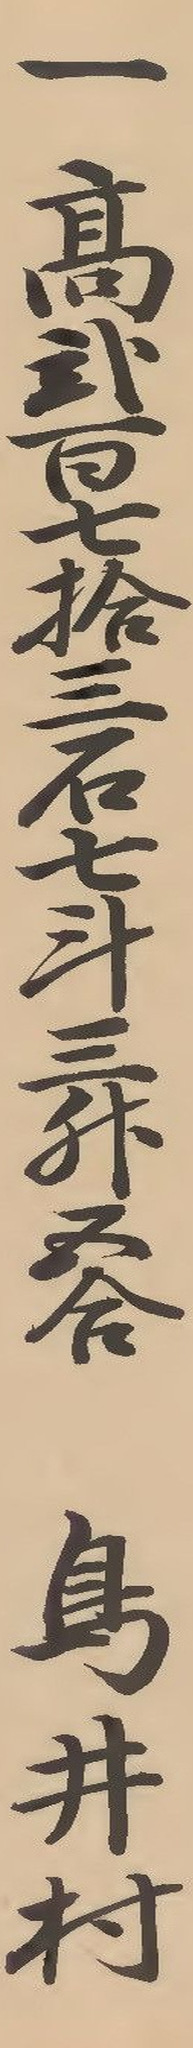一高弐百七拾三石七斗三升五合鳥井村
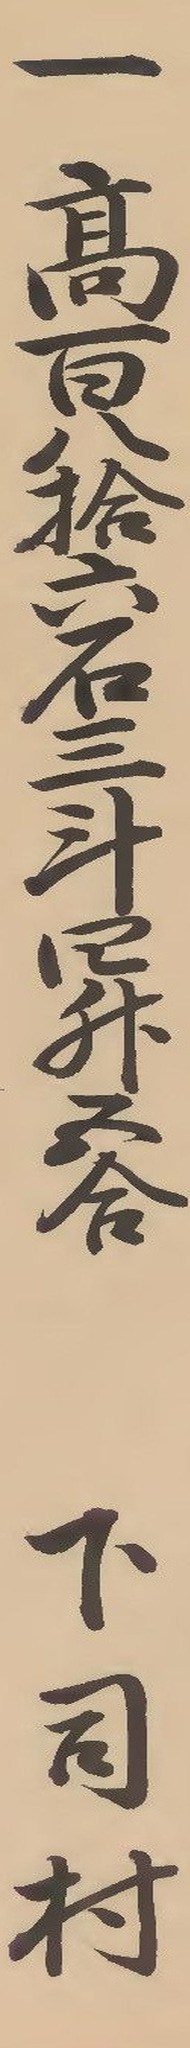一高百八拾六石三斗四升五合下司村
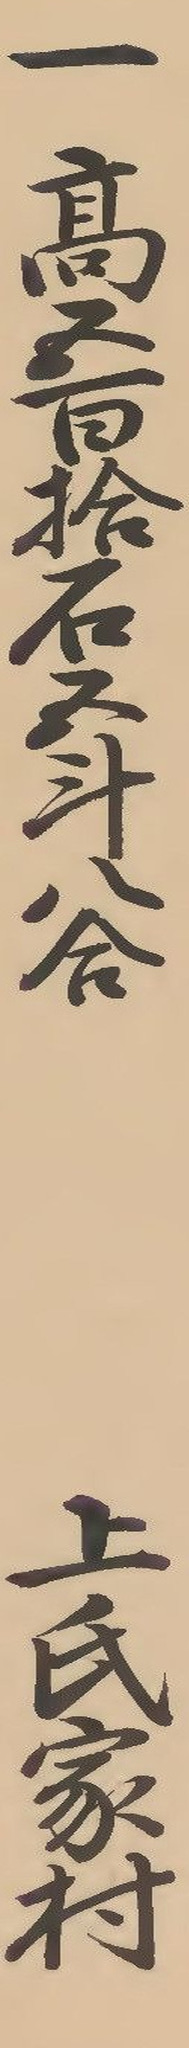一高五百拾石五斗八合上氏家村

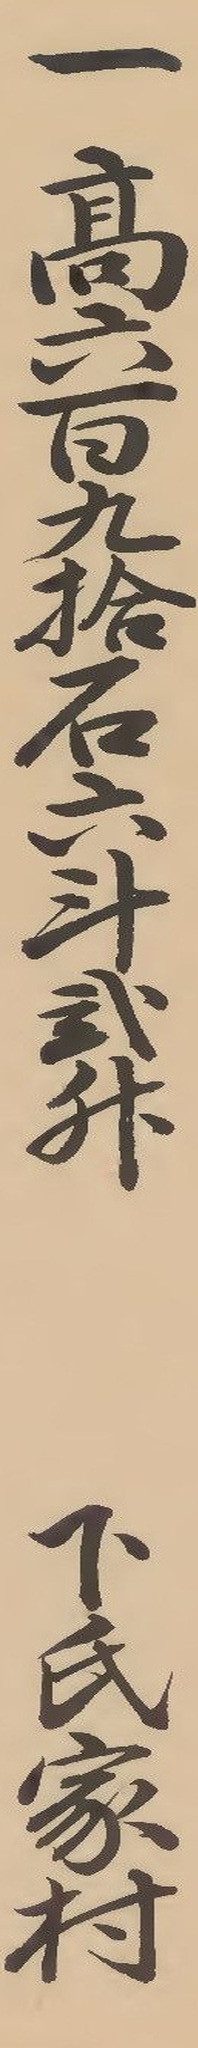一高六百九拾石六斗弐升下氏家村
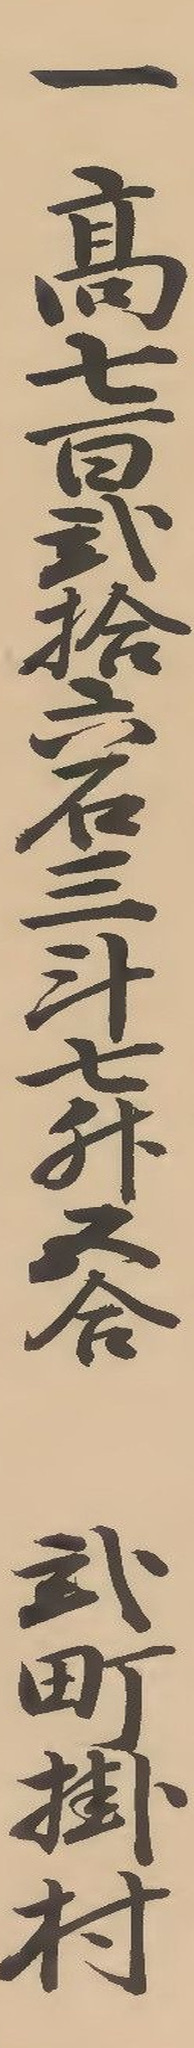一高七百弐拾六石三斗七升五合弐町掛村
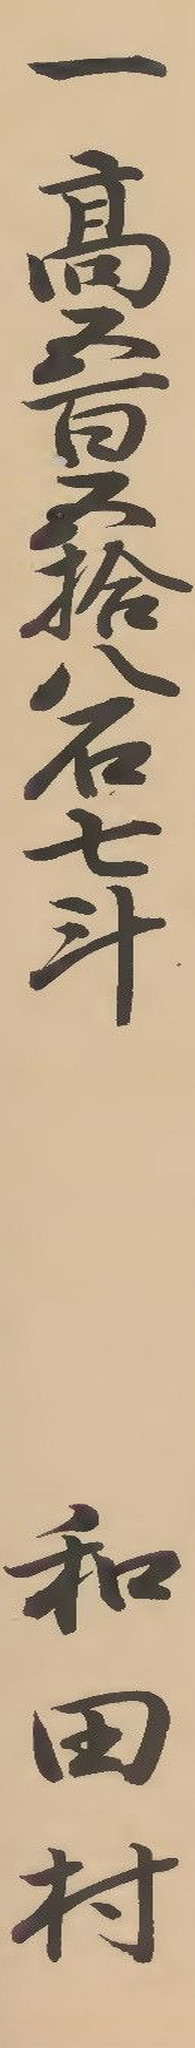一高五百五拾八石七斗和田村
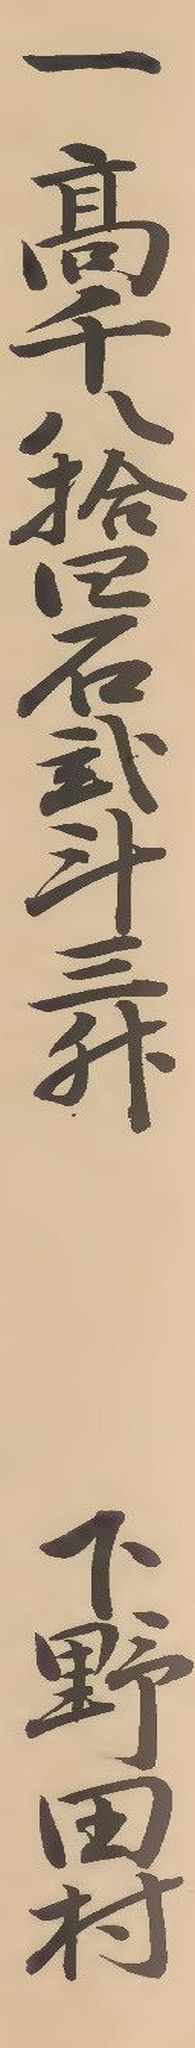一高千八拾四石弐斗三升下野田村
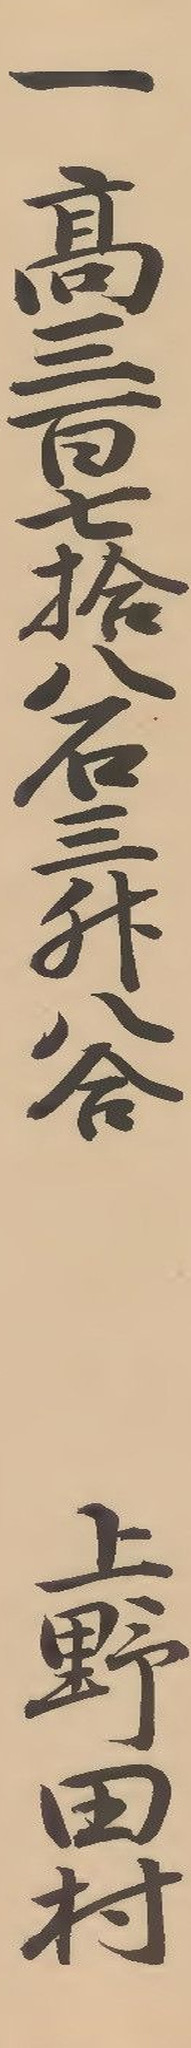一高三百七拾八石三升八合上野田村
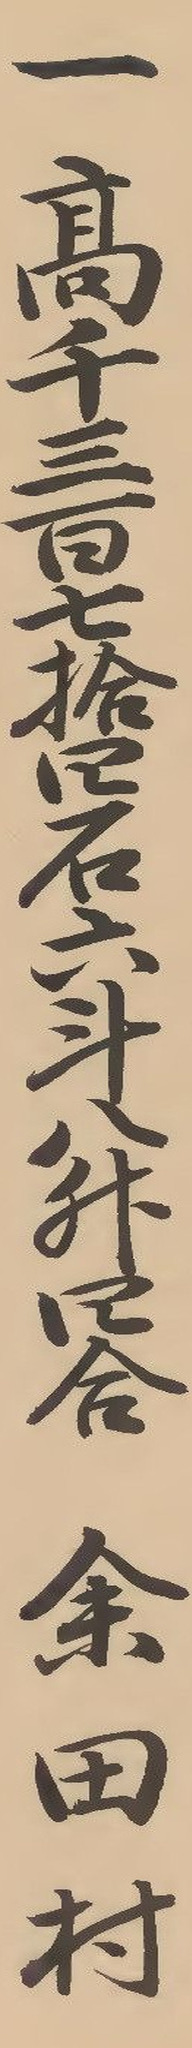一高千三百七拾四石六斗八升四合余田村
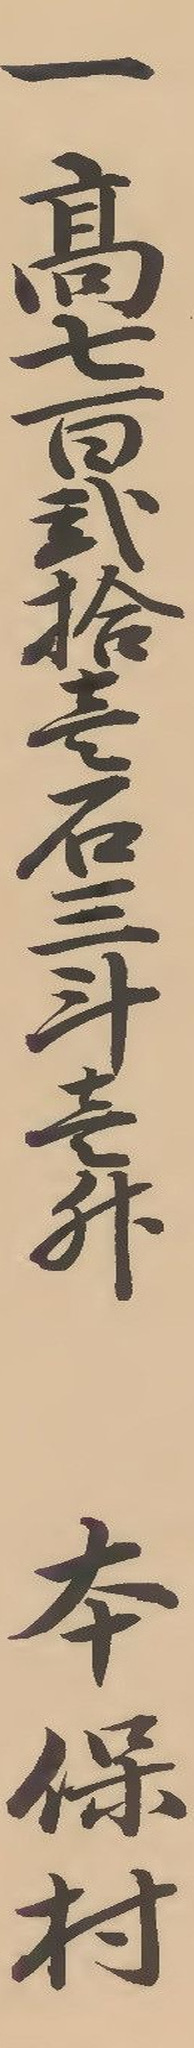一高七百弐拾壱石三斗壱升本保村

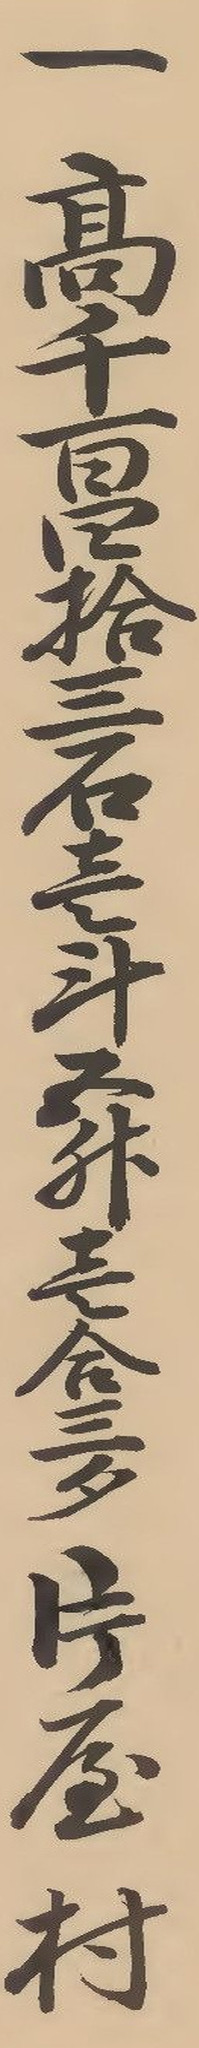一高千百四拾三石壱斗五升壱合三勺片屋村
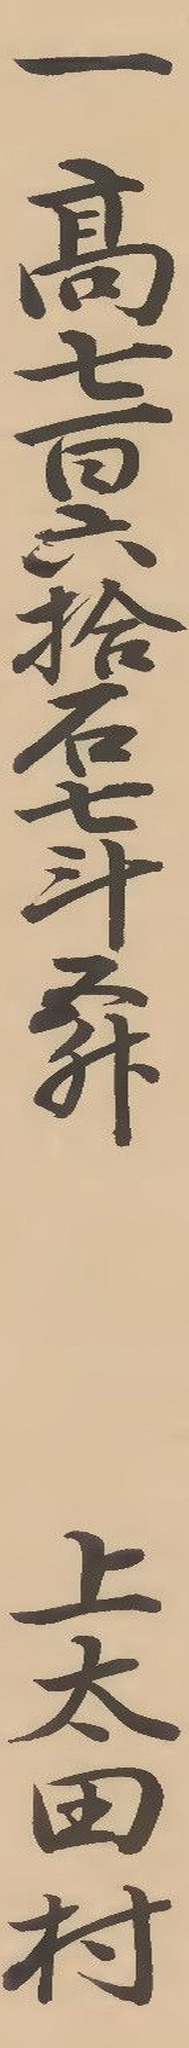一高七百六拾石七斗五升上太田村
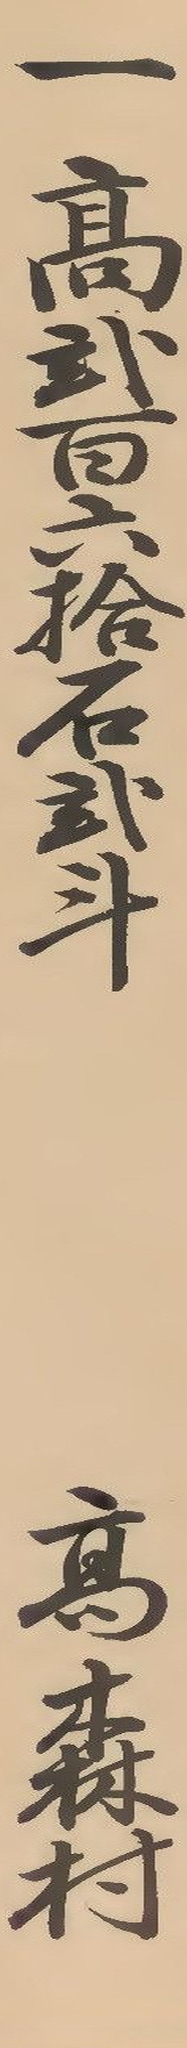一高弐百六拾石弐斗高森村
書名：越前国郷帳
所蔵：国立公文書館 National Archives of Japan
